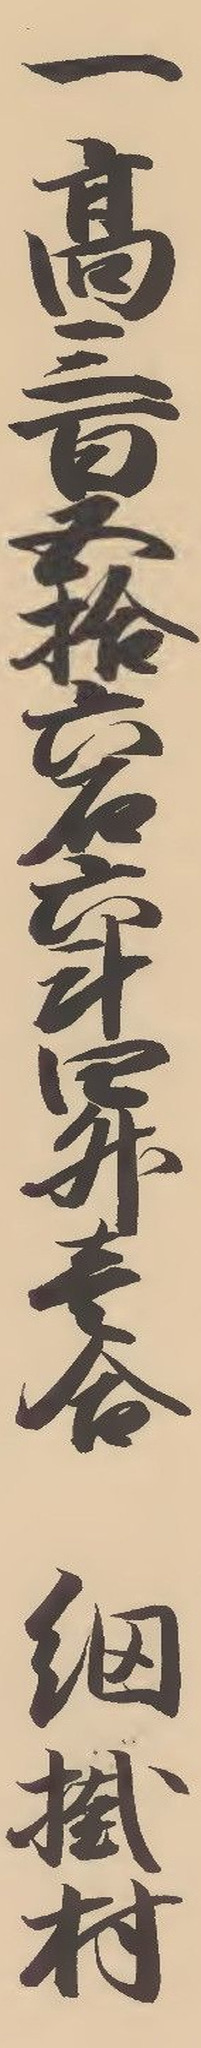一高三百五拾六石六斗四升壱合網掛村
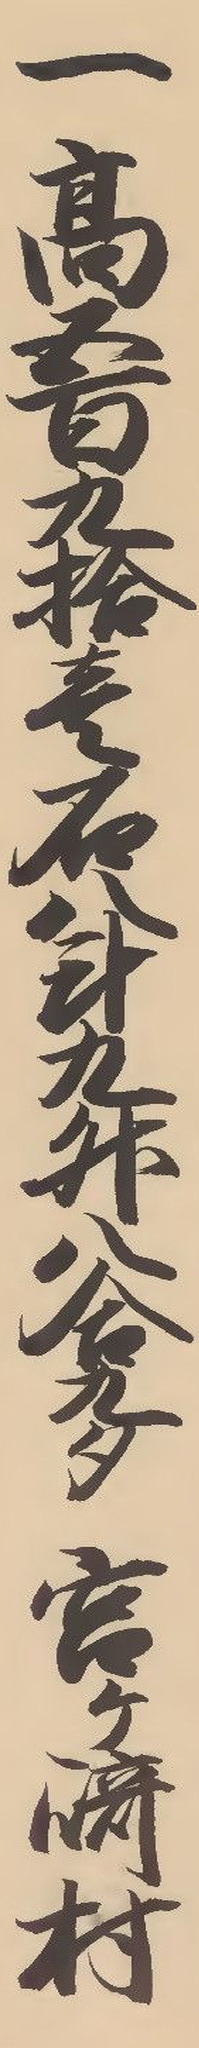一高五百九拾壱石八斗九升八合九勺宮ヶ崎村
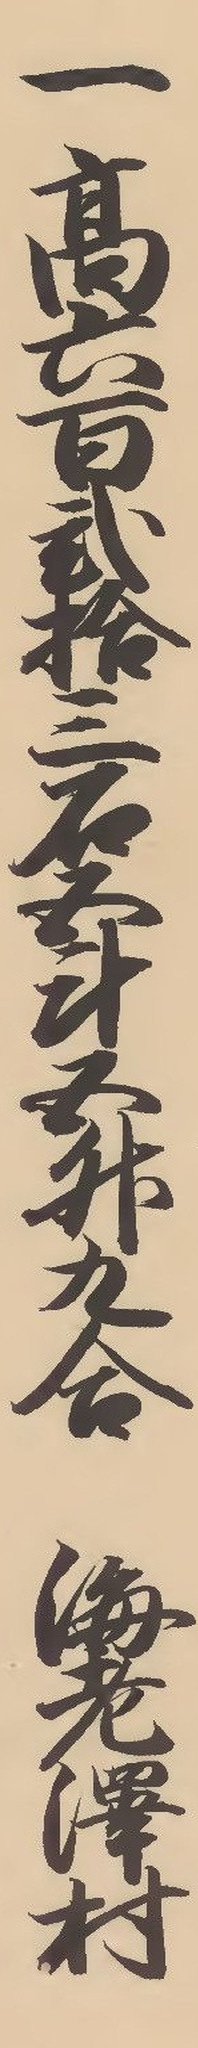一高六百弐拾三石五斗五升九合海老沢村
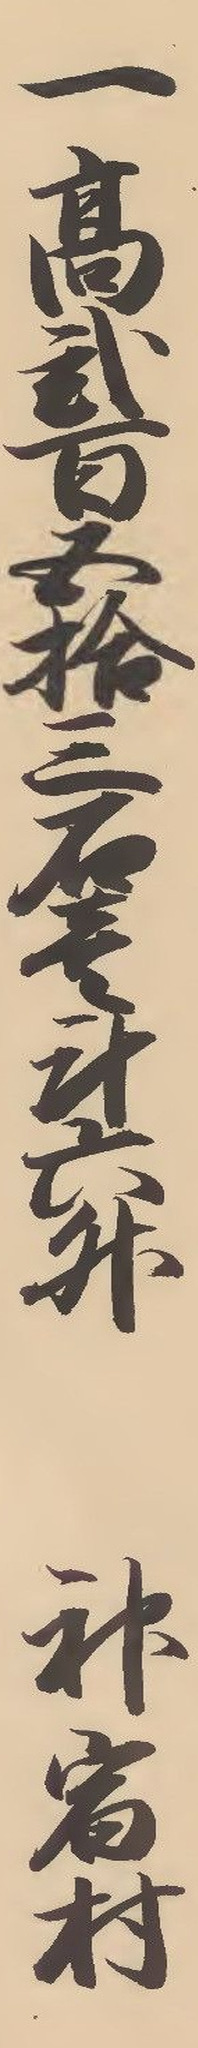一高弐百五拾三石壱斗六升神宿村
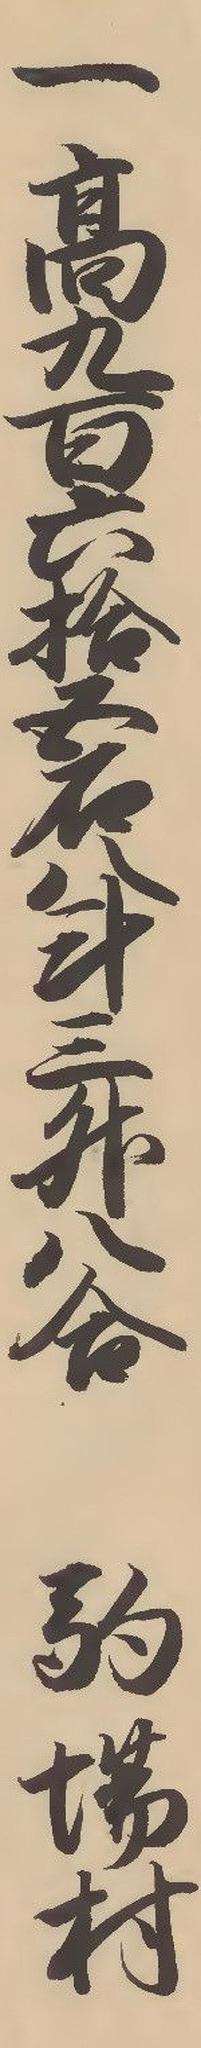一高九百六拾五石八斗三升八合駒場村
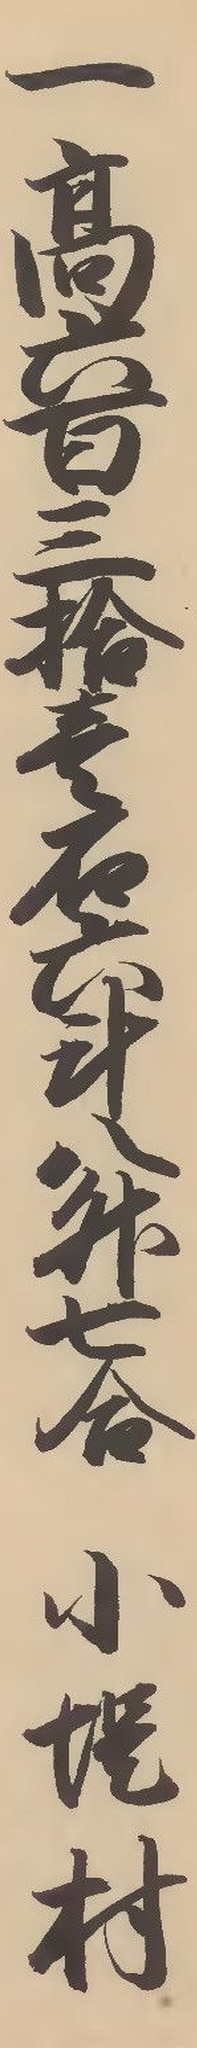一高六百三拾壱石六斗八升七合小堤村
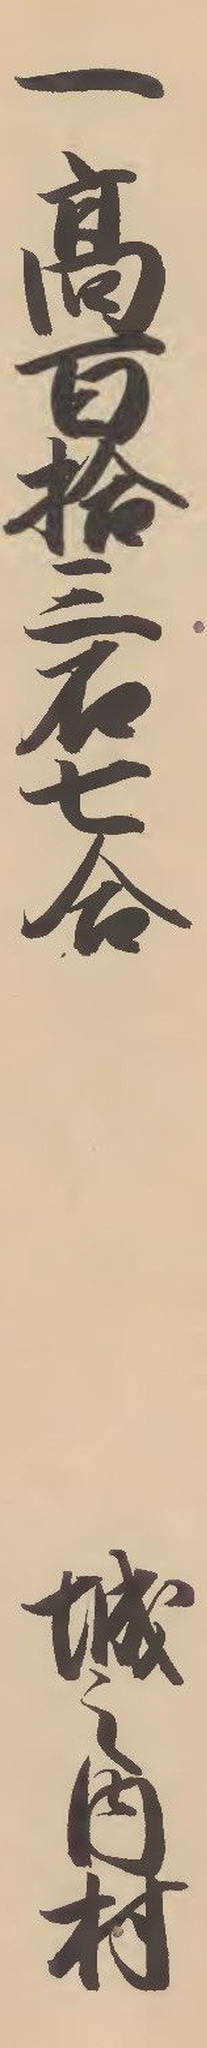一高百拾三石七合城之内村
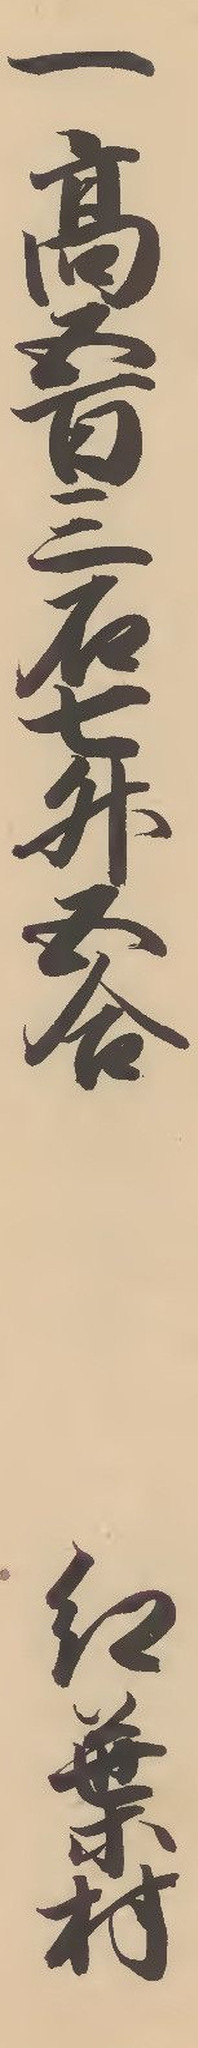一高五百三石七升五合紅葉村

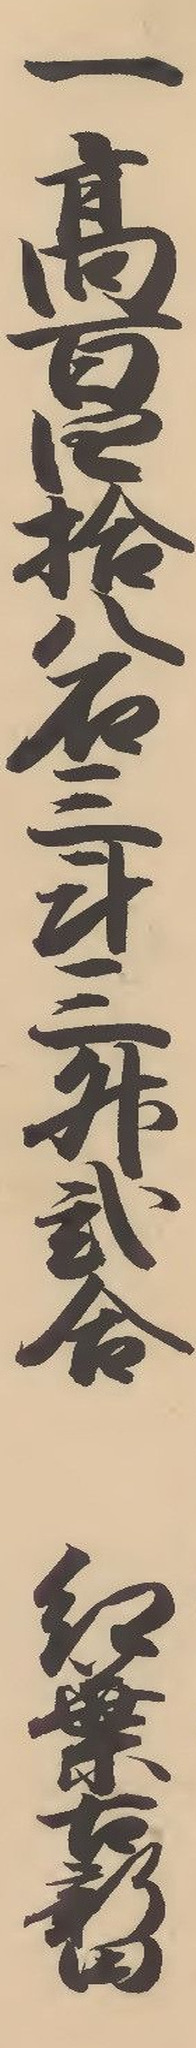一高百四拾八石三斗三升弐合紅葉古新田
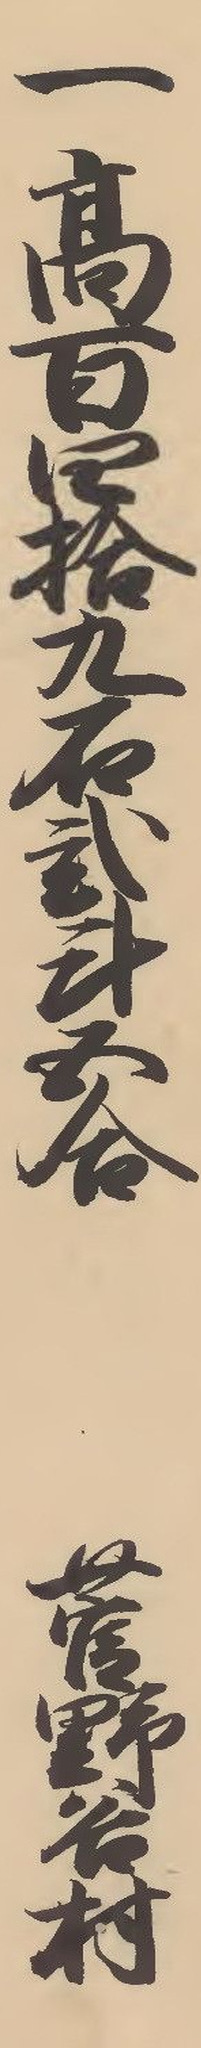一高百四拾九石弐斗五合菅野谷村
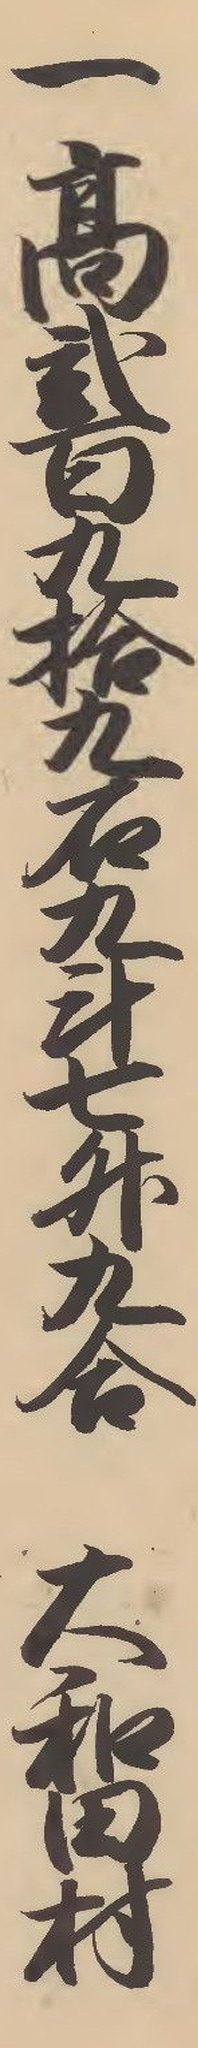一高弐百九拾九石九斗七升九合大和田村
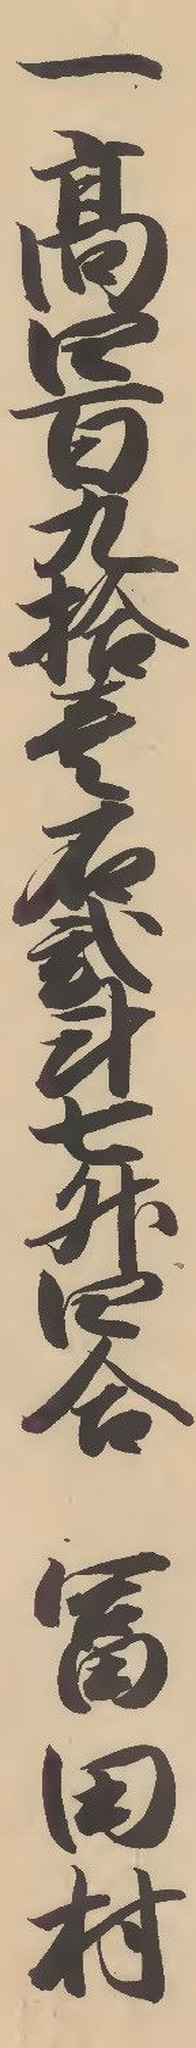一高四百九拾壱石弐斗七升四合富田村
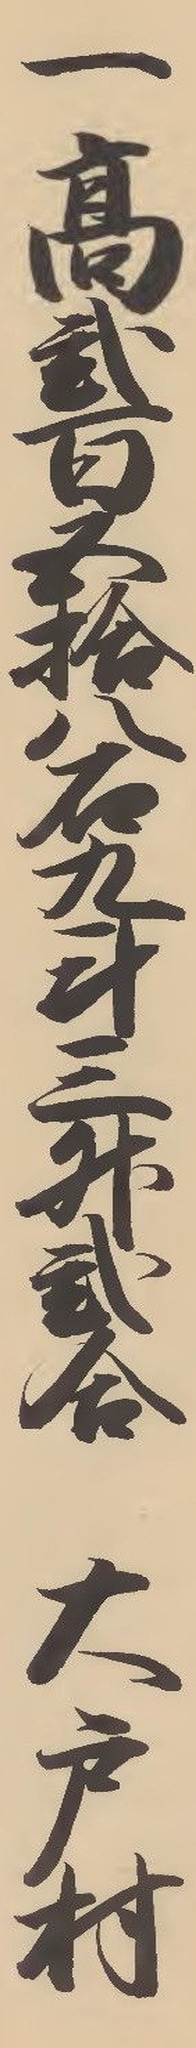一高弐百五拾八石九斗三升弐合大戸村
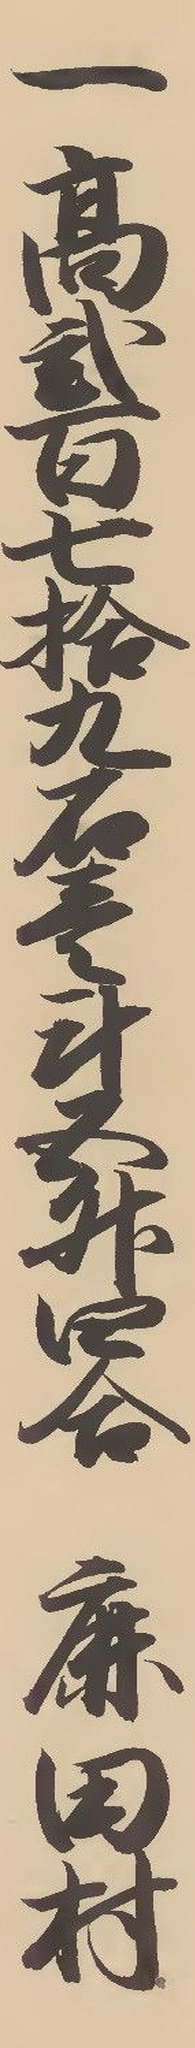一高弐百七拾九石壱斗五升四合鹿田村
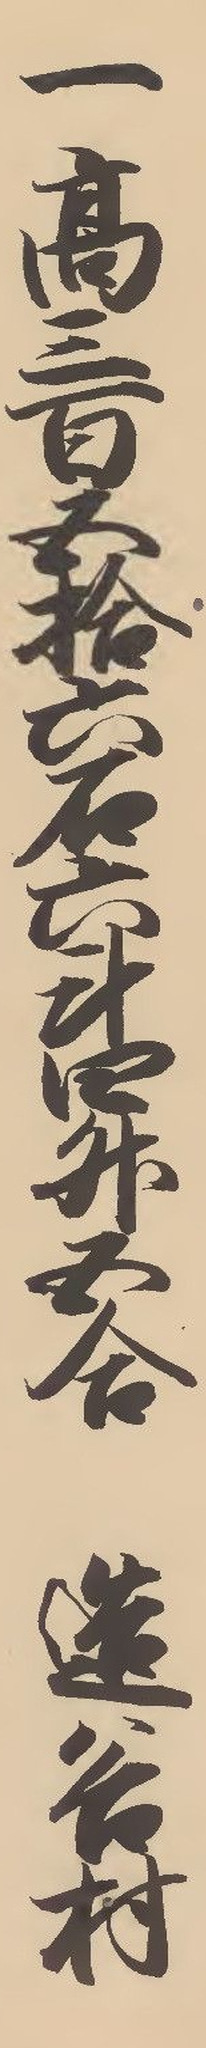一高三百五拾六石六斗四升五合造谷村
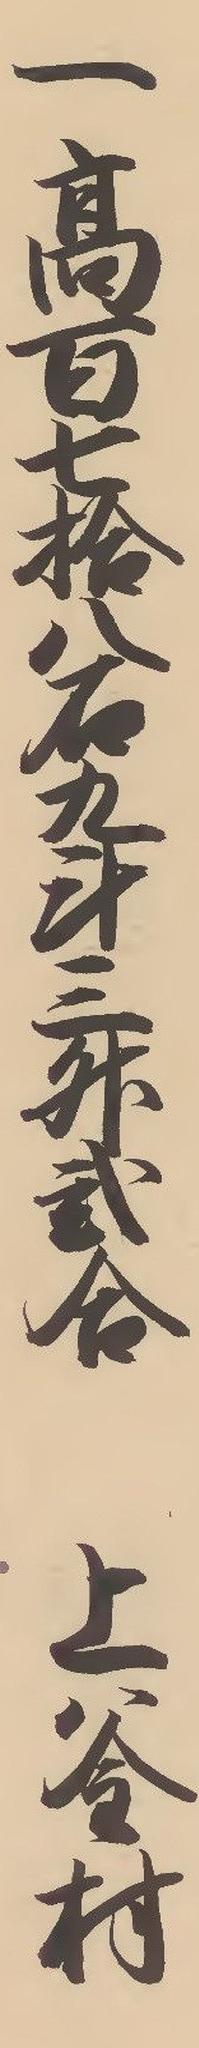一高百七拾八石九斗三升弐合上釜村
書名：常陸国郷帳
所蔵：国立公文書館 National Archives of Japan
